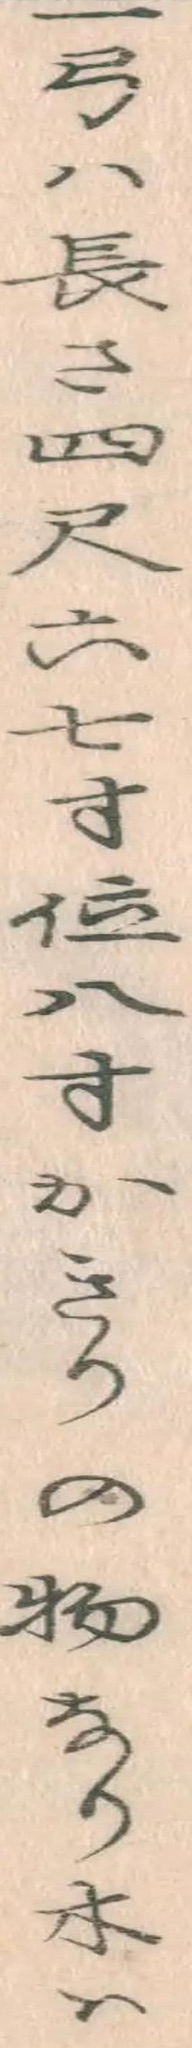一弓は長さ四尺六七寸位八寸かきりの物なり木は
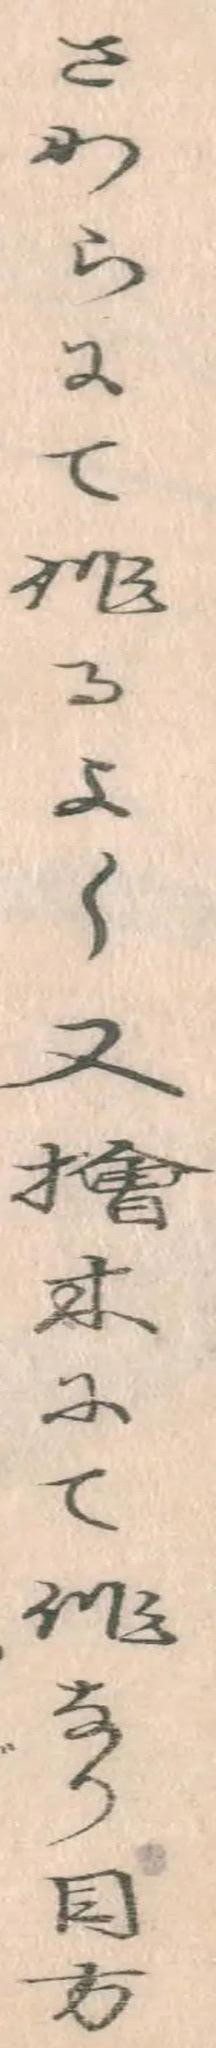さわらにて作るよし又桧木にて作なり目方
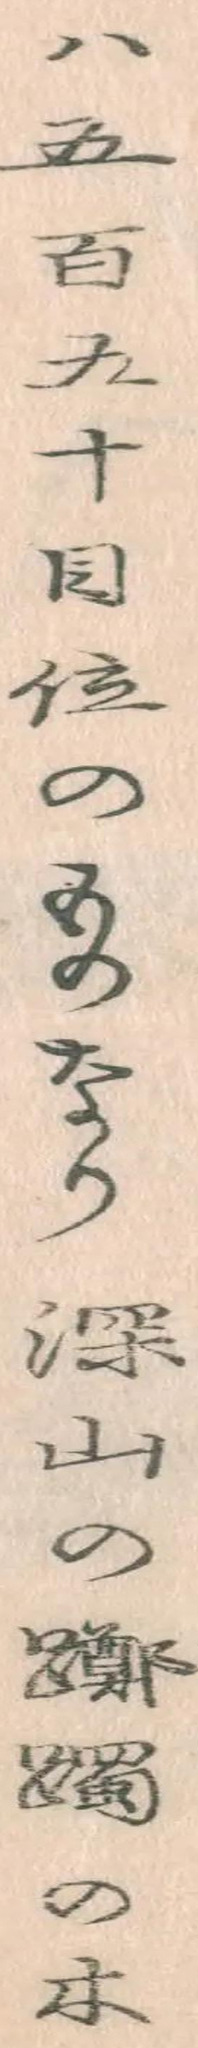は五百九十目位のものなり深山の躑躅の木
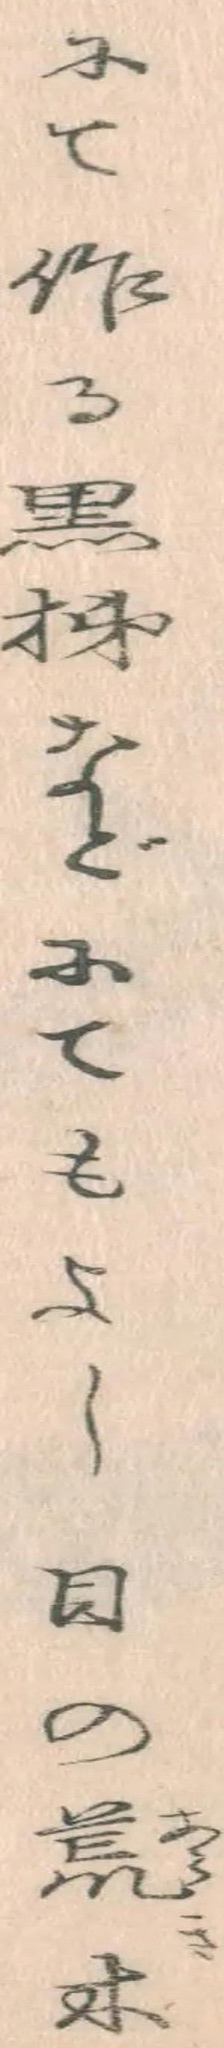にて作る黒柿などにてもよし目の荒木
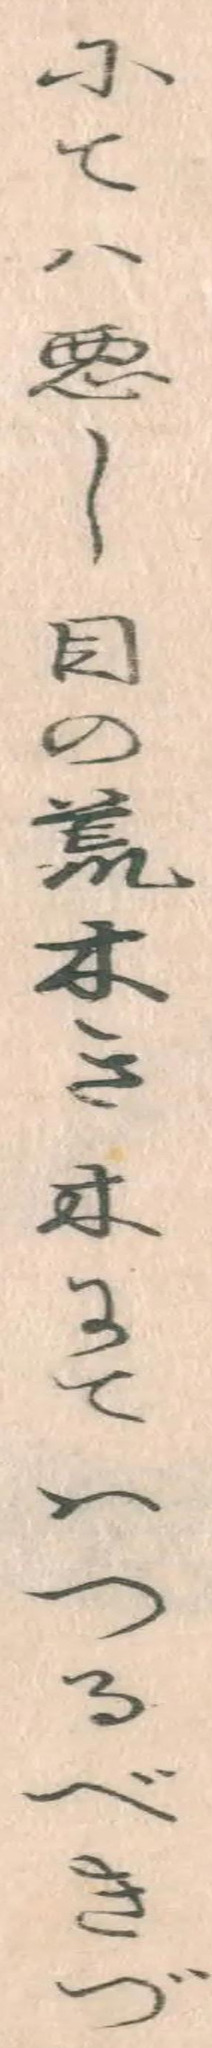にては悪し目の荒木き木にてはつるべきづ
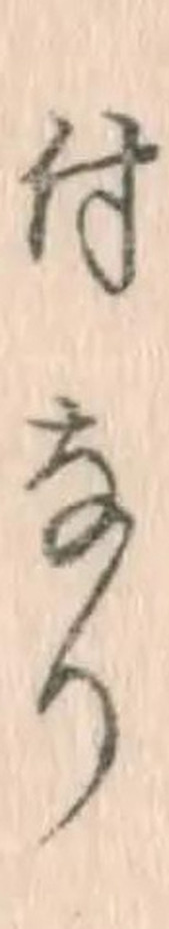付なり
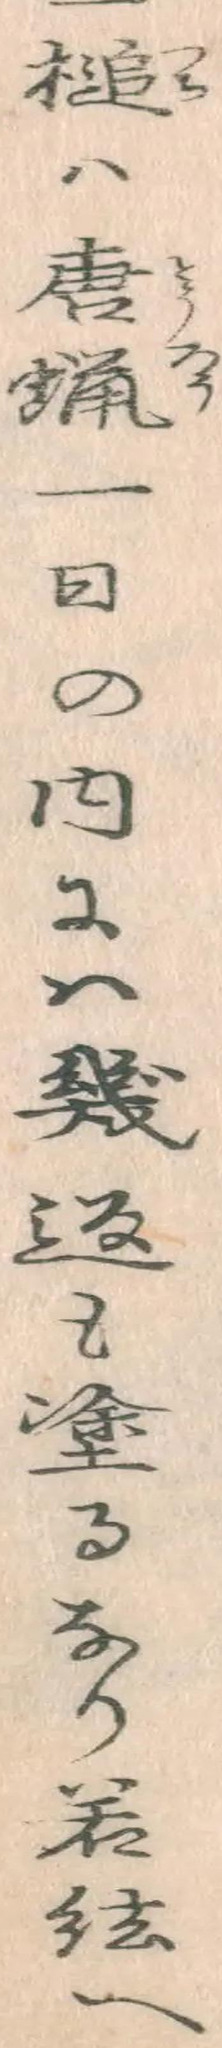一槌は唐蝋一日の内には幾返も塗るなり若絃へ
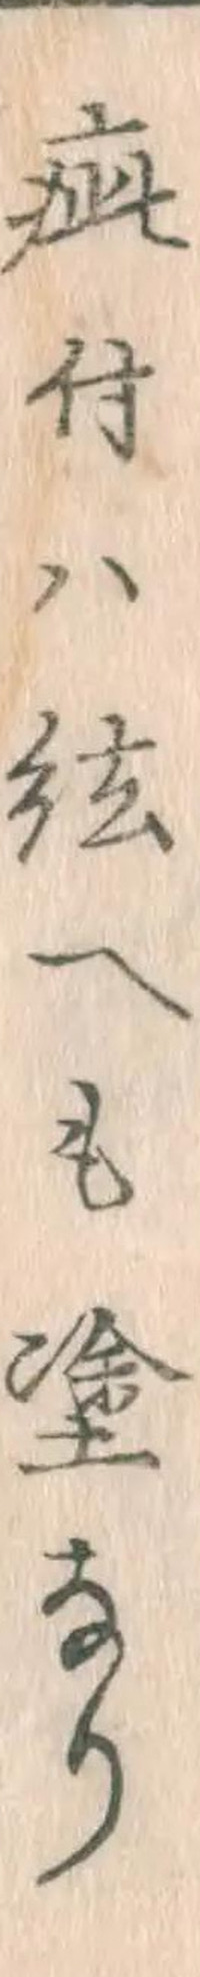疵付は絃へも塗なり
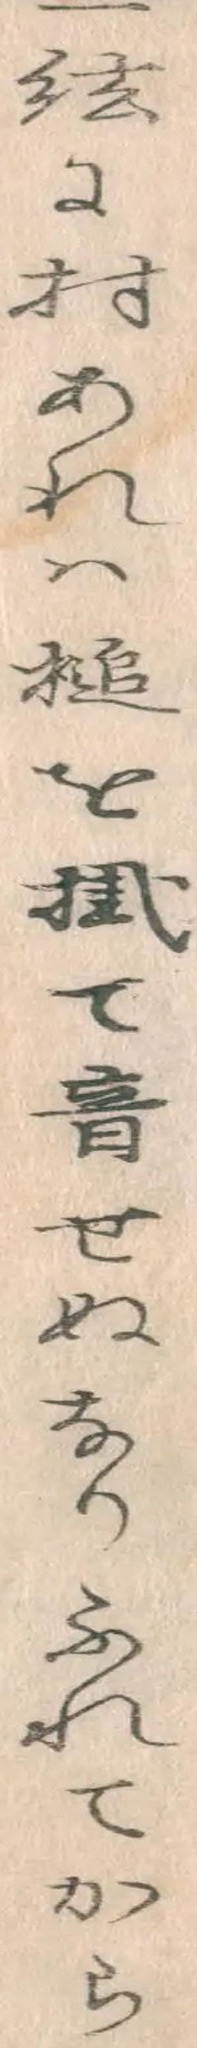一絃に村あれは槌を掛て音せぬなりふれてから
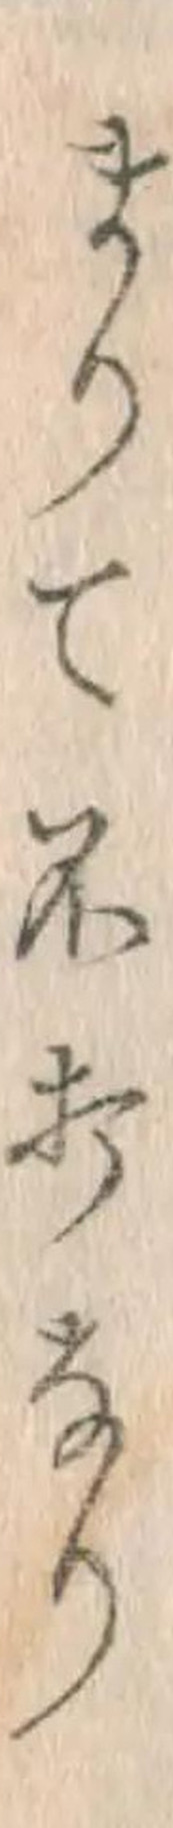まりて不打なり
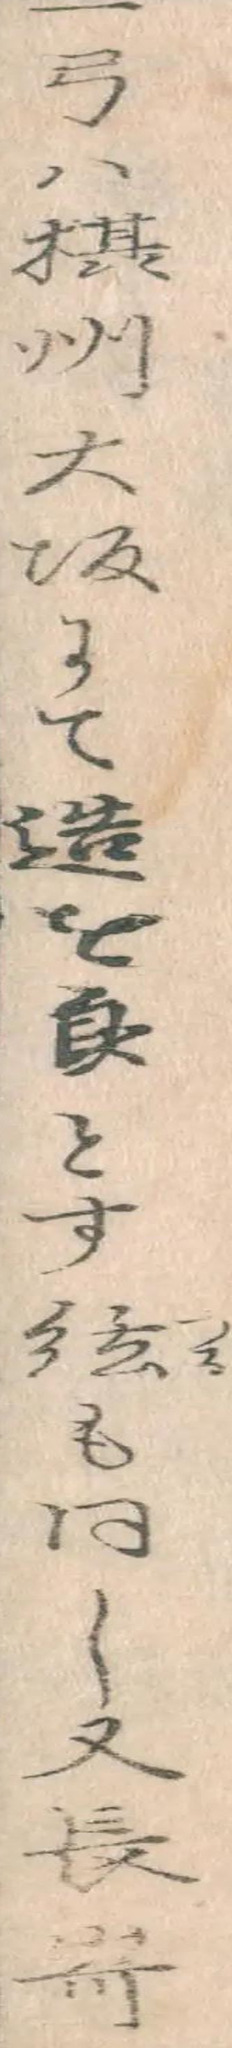一弓は欇州大坂にて造を良とす絃も同し又長崎

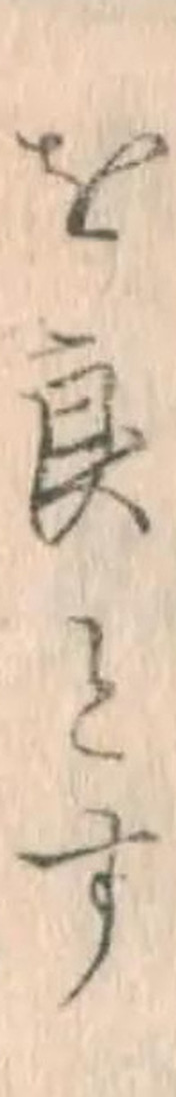を良とす
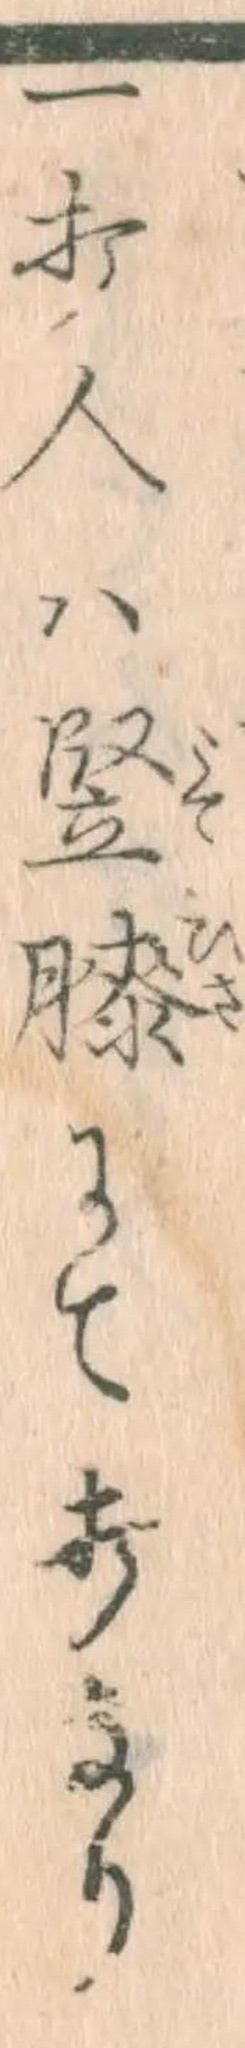一打人は竪膝にて打つなり

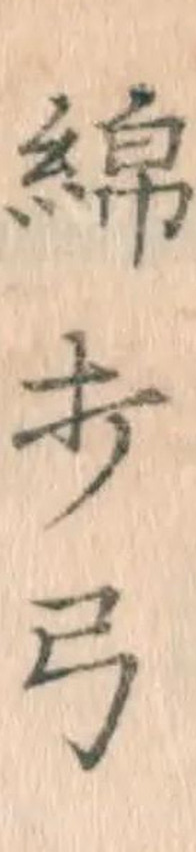綿打弓
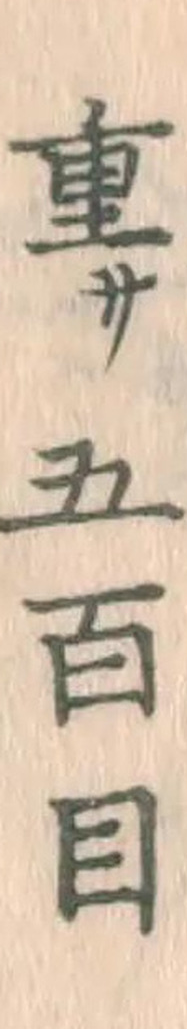重さ五百目
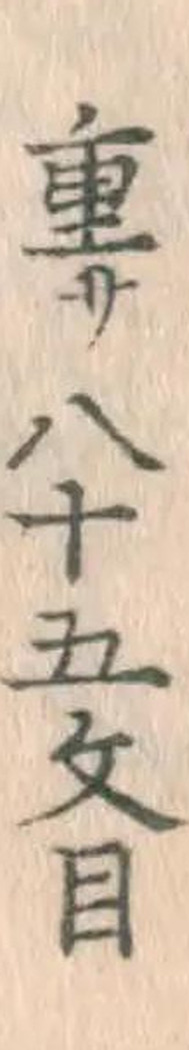槌重さ八十五文目
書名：機織彙編 5巻. [1]
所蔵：国立国会図書館 National Diet Library, JAPAN
